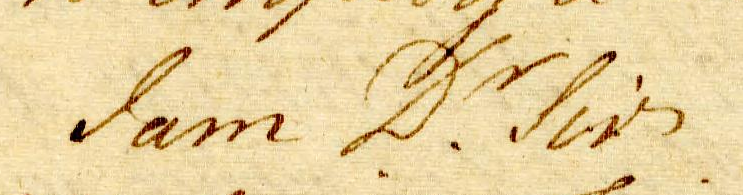I am D^r. Sir
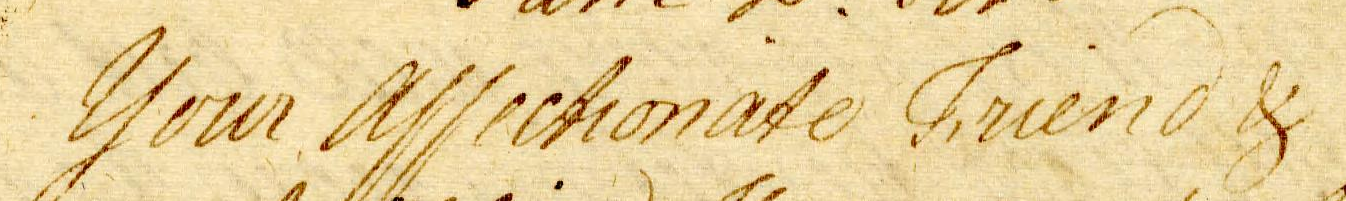Your Affectionate Friend &
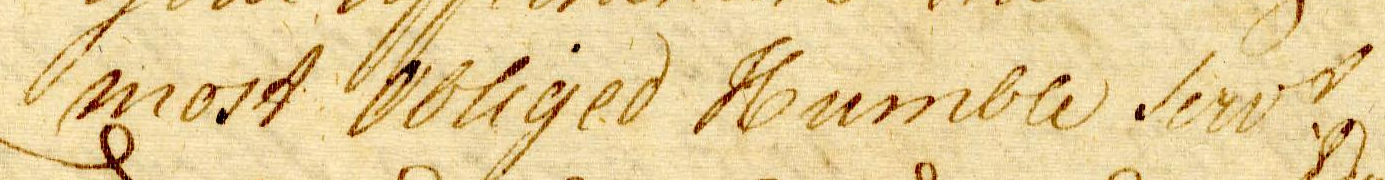most Obliged Humble Serv^t.
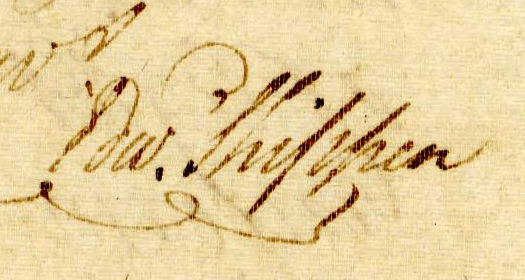Edw^d. Shippen
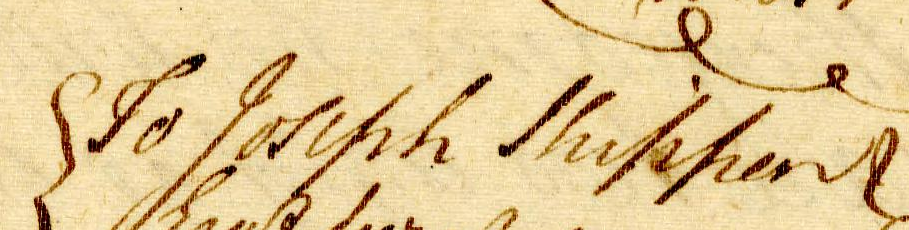To Joseph Shippen
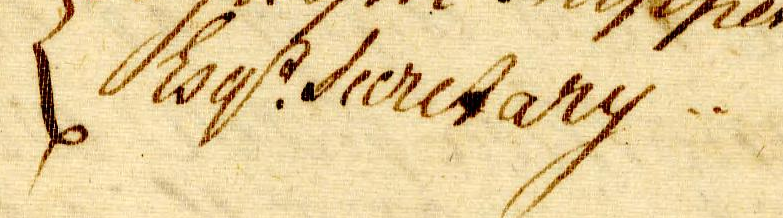Esq^r. Secretary..
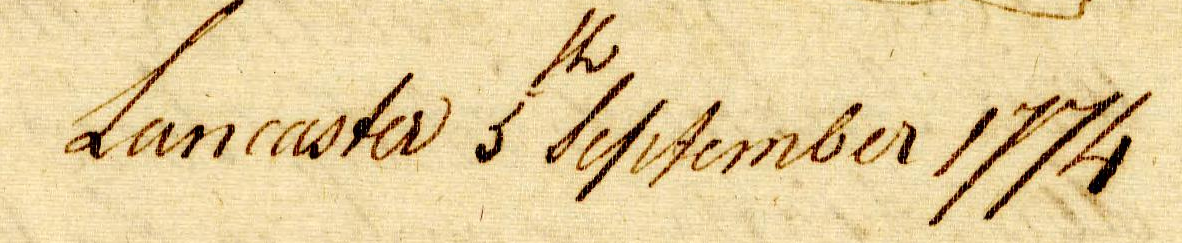Lancaster 3^th September 1774
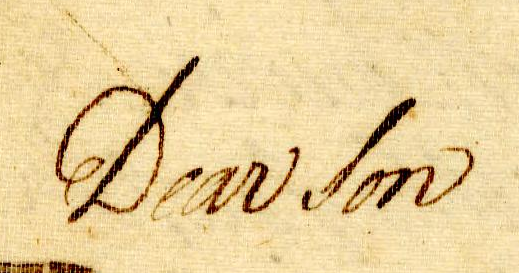Dear Son
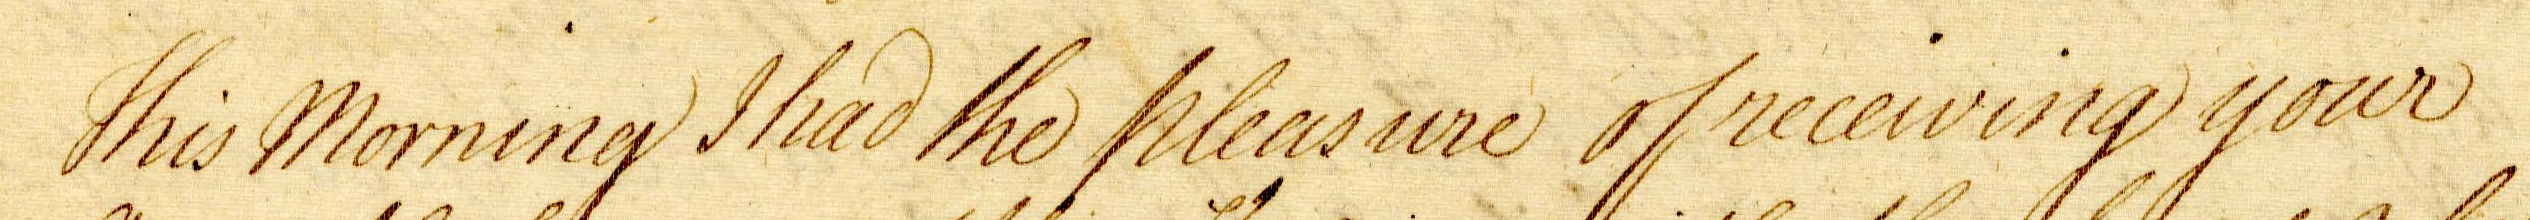this Morning I had the pleasure of receiving your
